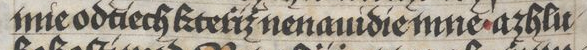mie odtiech kteṙíż nenauidie mne.a zhlu¬
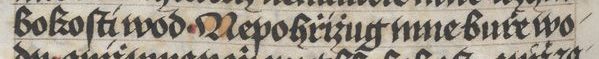bokoſtí wod.Nepohṙiżug mne buṙe wo¬
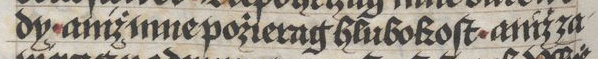dy.aniż mne pożierag hlubokoſt.aniż za¬
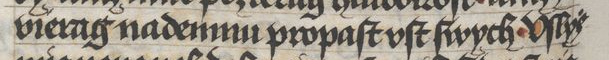vierag nademnu propaſt vſt ſwych.Uſlyṡ
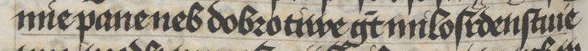mie pane neb dobrotiwe ḡt miloſrdenſtuíe
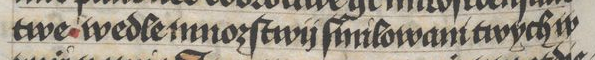twe.wedle mozſtwij ſmilowaní twych w
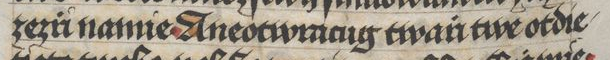zezṙi namie.Aneotwracug twaṙi twe otdíe¬
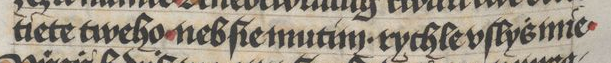tiete tweho.neb ſie mutím.rychle vſlyš mie.
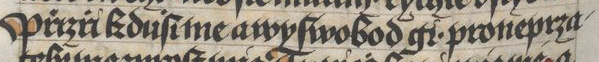Pṙizṙi kduẛi me a wyſwobod gi.proneprza¬
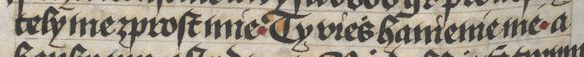tely me zproſt mie.Ty vieṡ hanienie mé.a
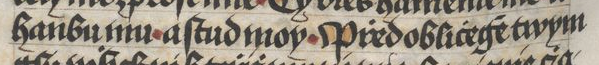hanbú mu.a ſtud moy.Pṙed obliċegē twym
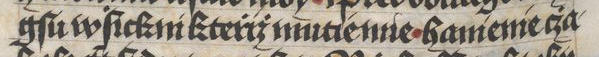gſu vẛickni kteṙíż mutiemie.hanienie cża¬
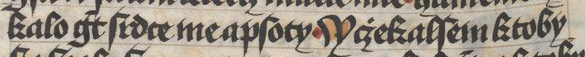kalo gt ſrdce me a pſoty.Y cżekalsem ktoby
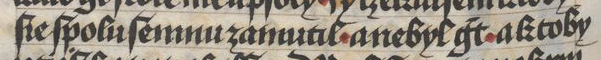ſie ſpolu ſemnu zamutil.anebyl ḡt.aktoby
